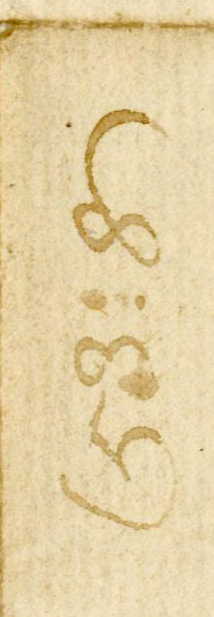53:8
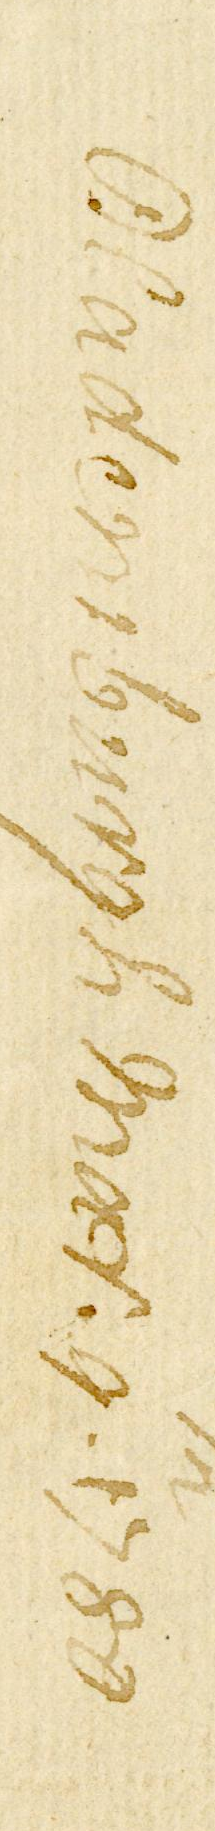Bladensburgh Mar 9^th 1780
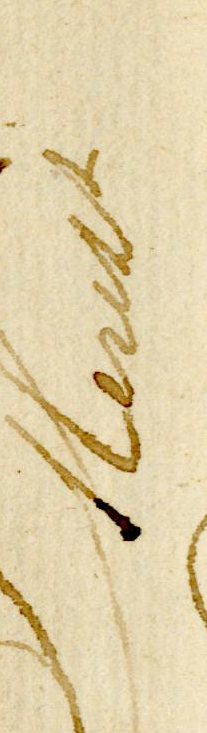Merch^t
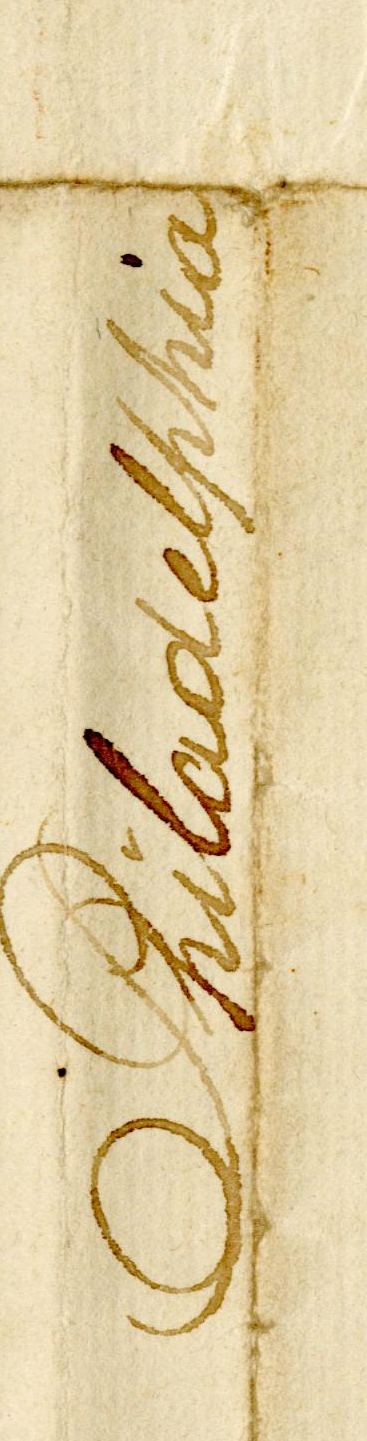Philadelphia
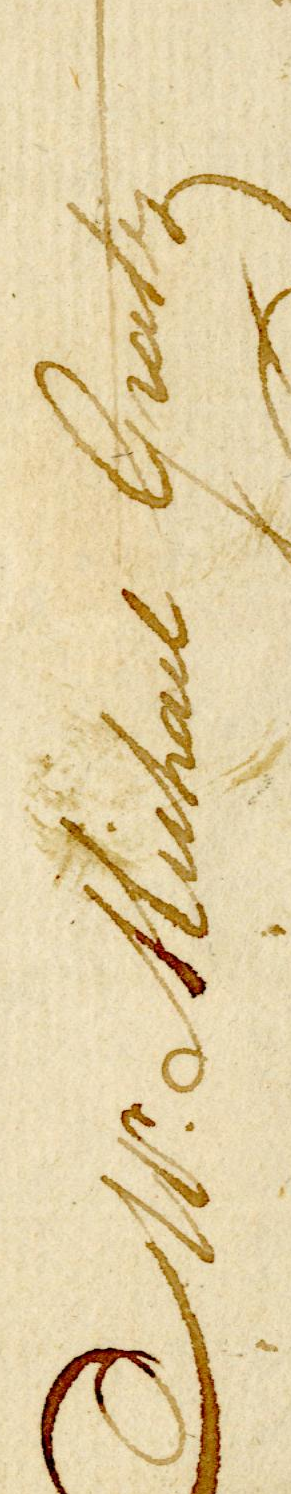M^r Michael Gratz
